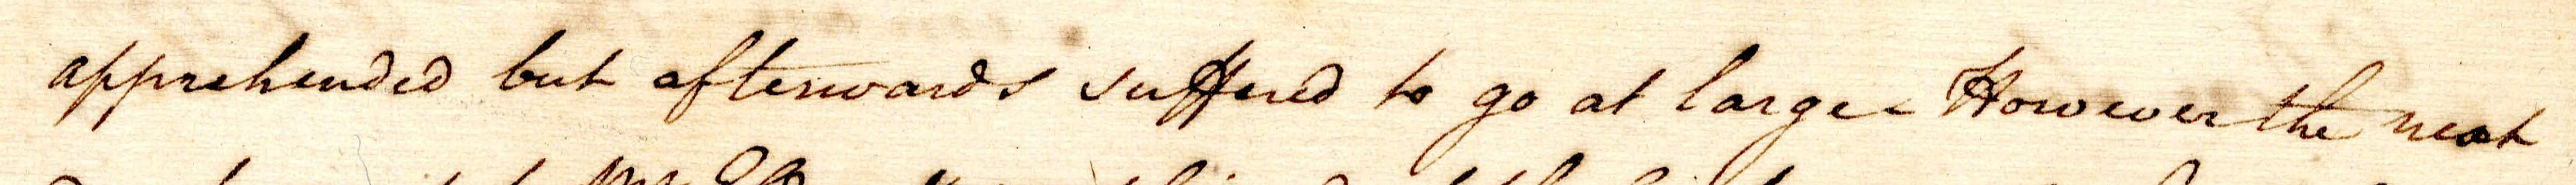apprehended but afterwards suffered to go at large. However the next
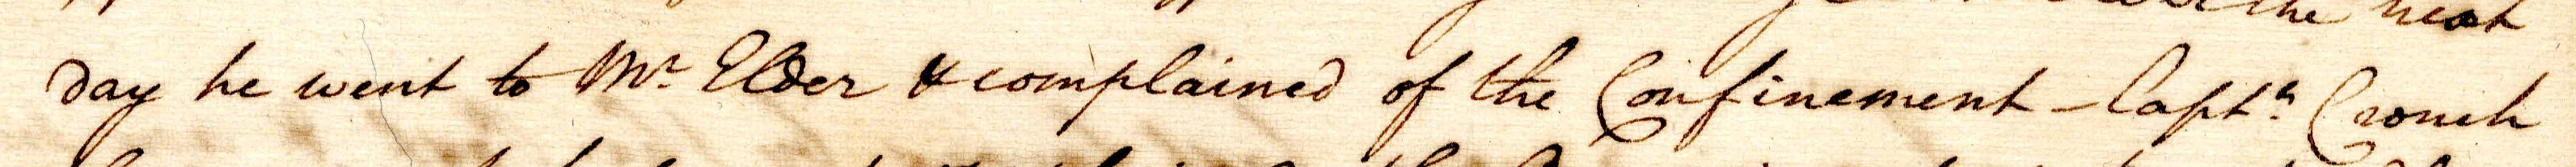day he went to M^r. Elder & complained of the Confinement. Capt^n. Crouch
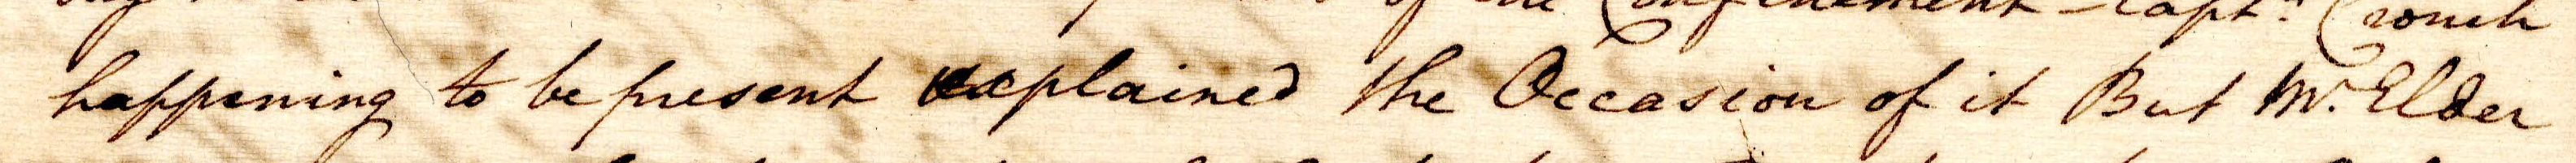happening to be present explained the Occasion of it. But M^r. Elder
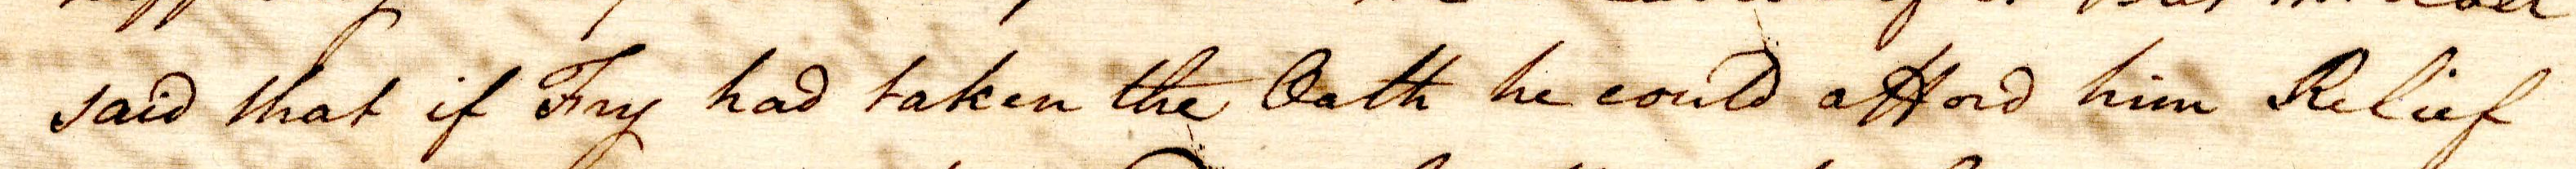said that if Fry had taken the Oath he could afford him Relief
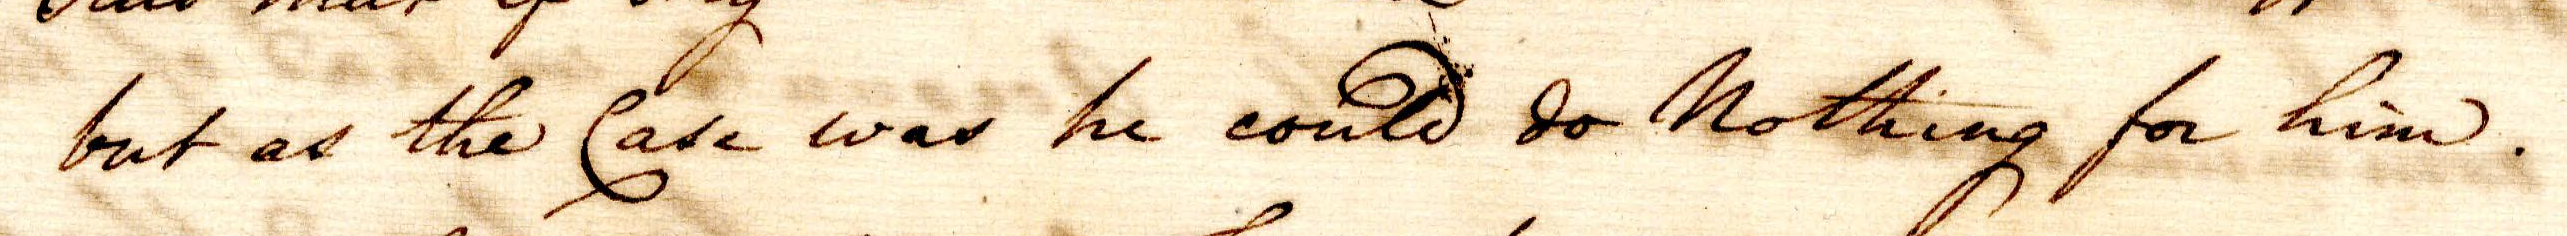but as the Case was he could do Nothing for him.
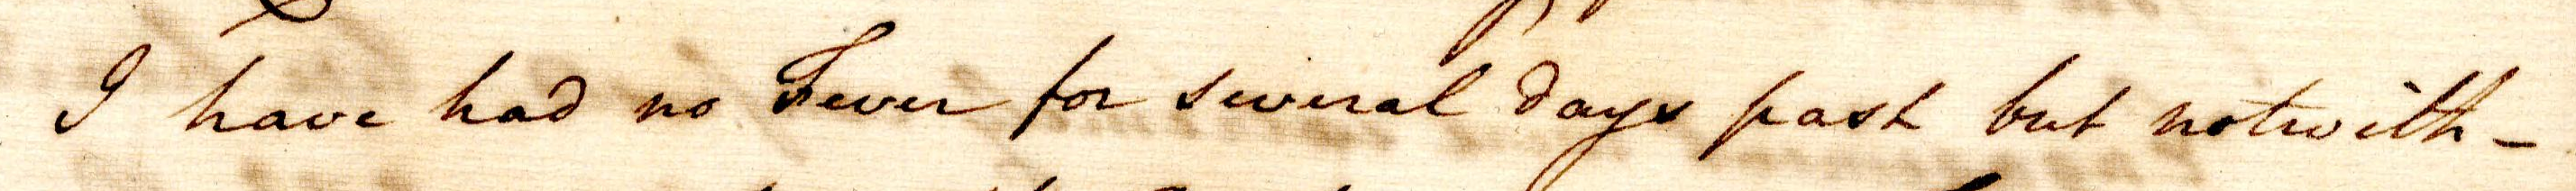I have had no Fever for several days past but notwith-
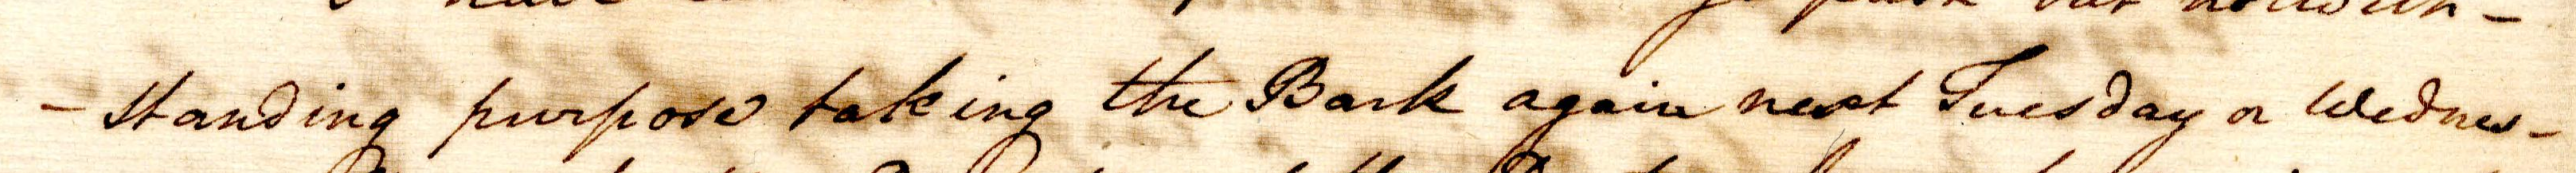-standing purposes taking the Bark again next Tuesday or Wednes-
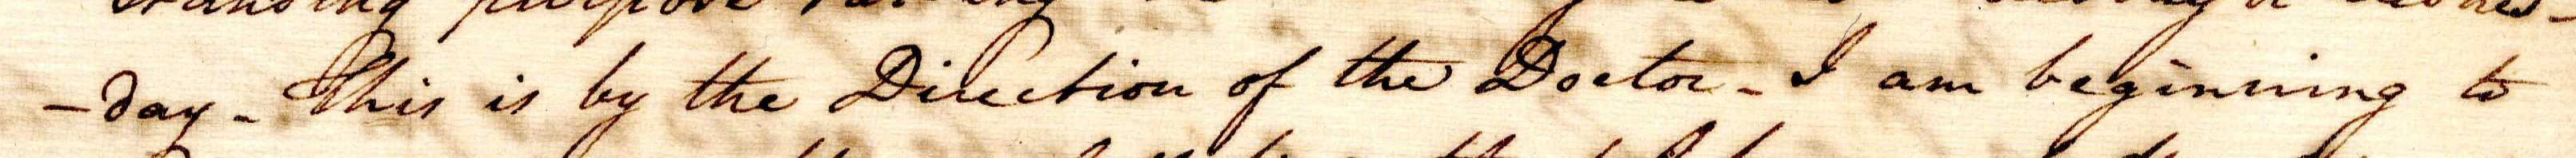-day. This is by the Direction of the Doctor. I am beginning to
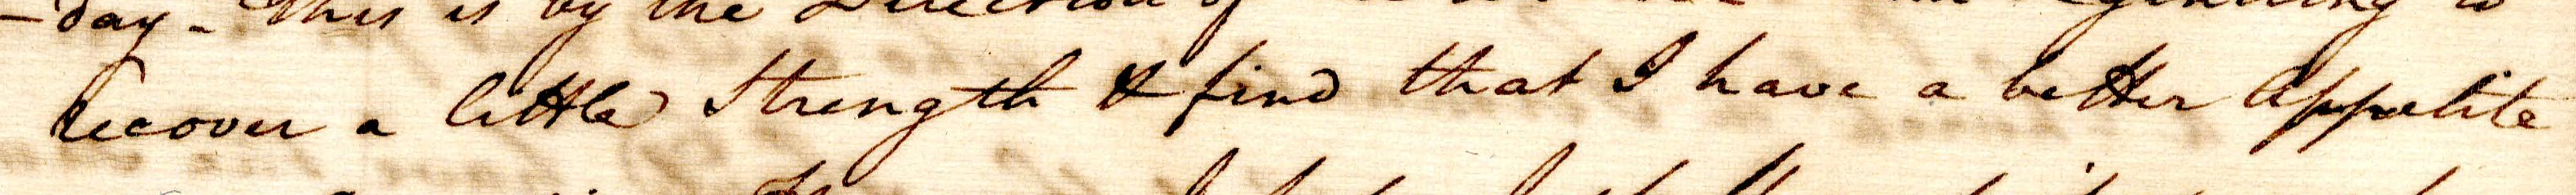recover a little Strength & find that I have a better Appetite
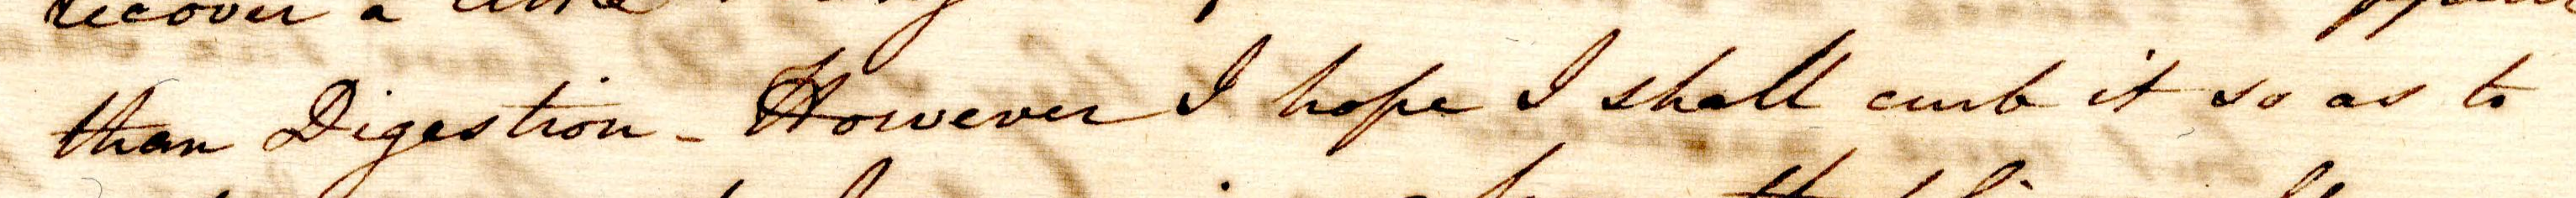than Digestion. However I hope I shall curb it so as to
